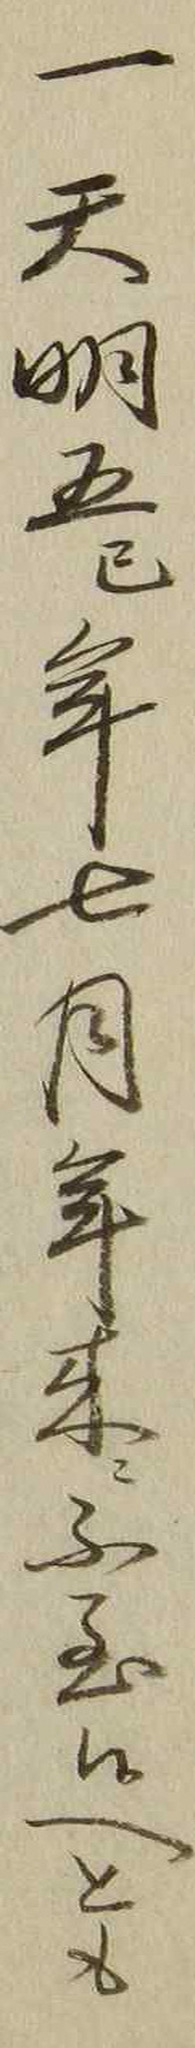一天明五巳年七月年来に不至候へとも
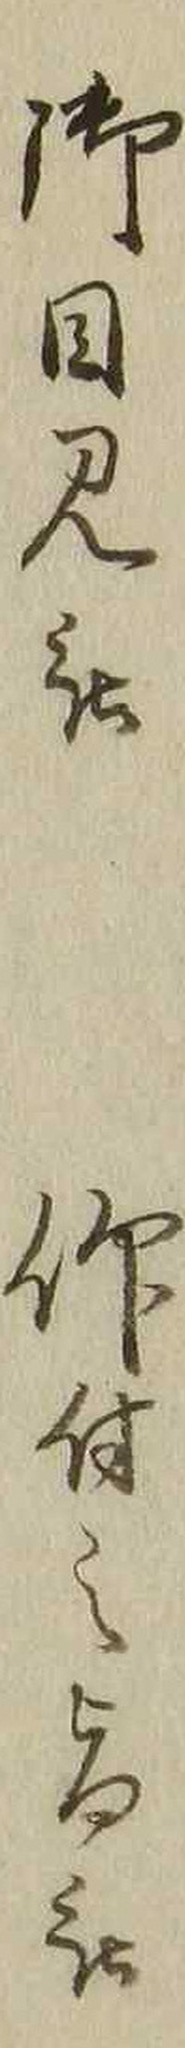御目見被仰付之旨被
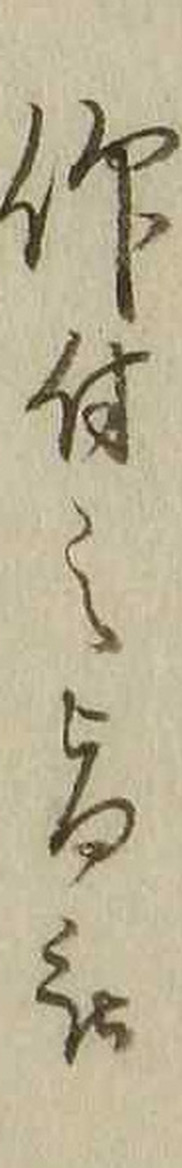御目見被仰付之旨被
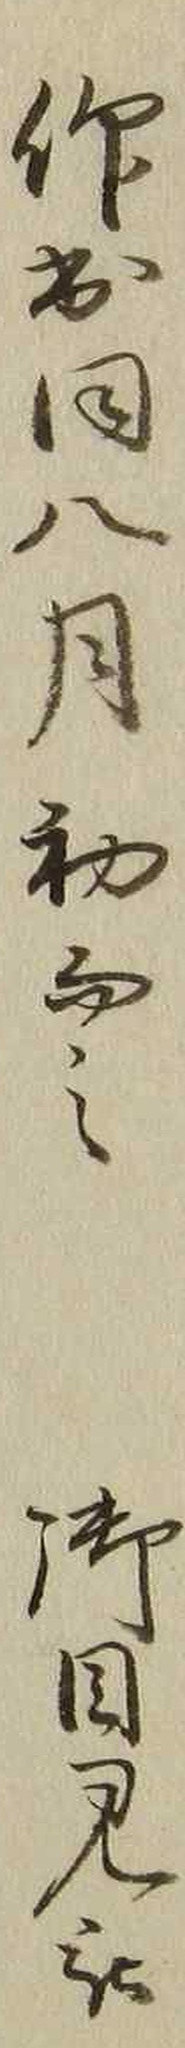仰出同八月初而之御目見被
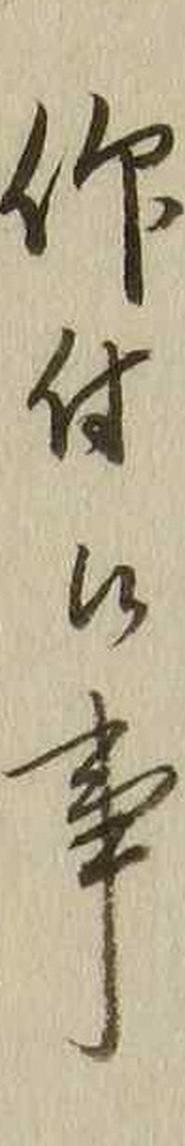仰付候事
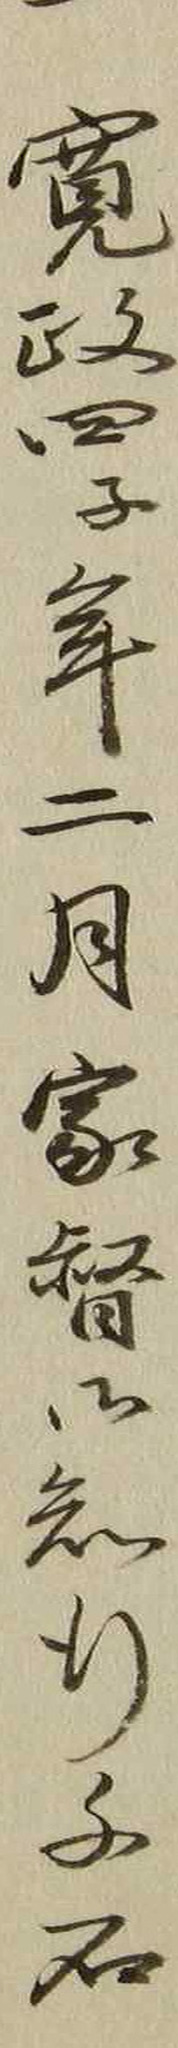一寛政四子年二月家督御知行千石
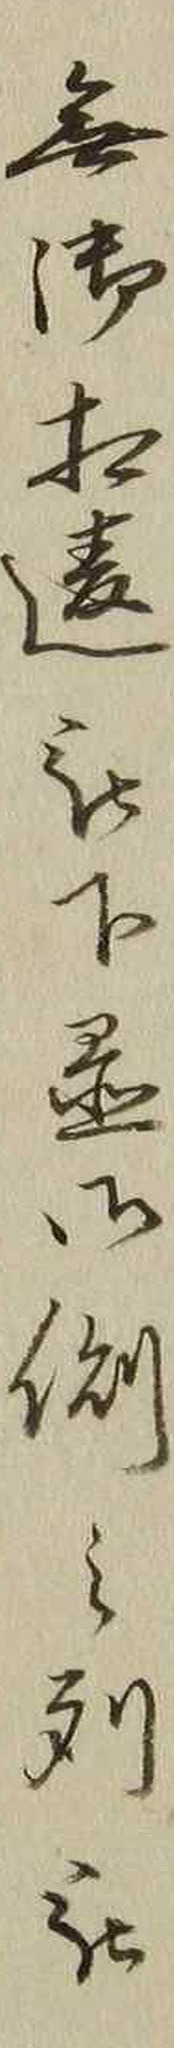無御相違被下置御側之列被
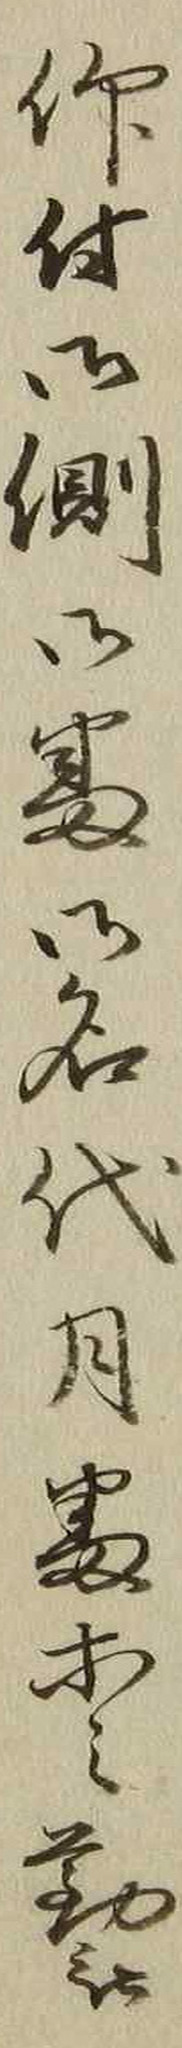仰付御側御番御名代月番等之勤被
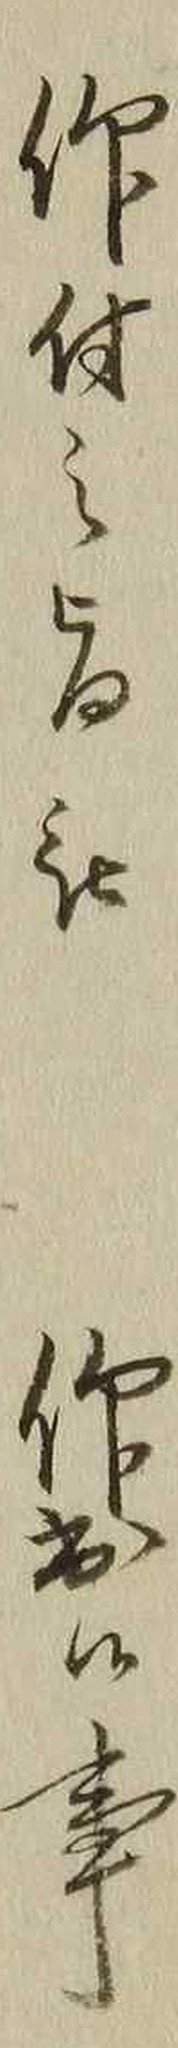仰付之旨被仰出候事
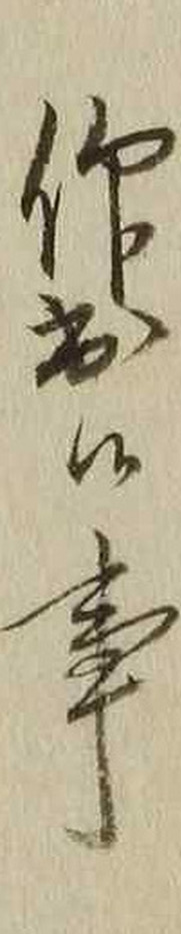仰付候事
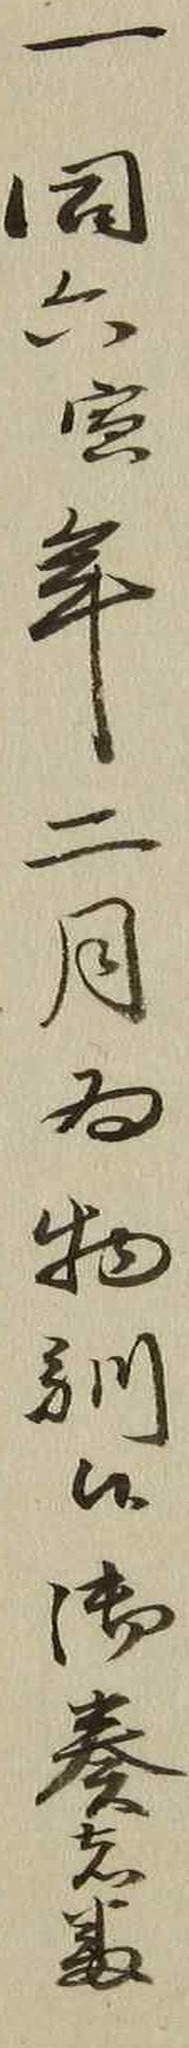一同六寅年二月為物馴候御奏者番
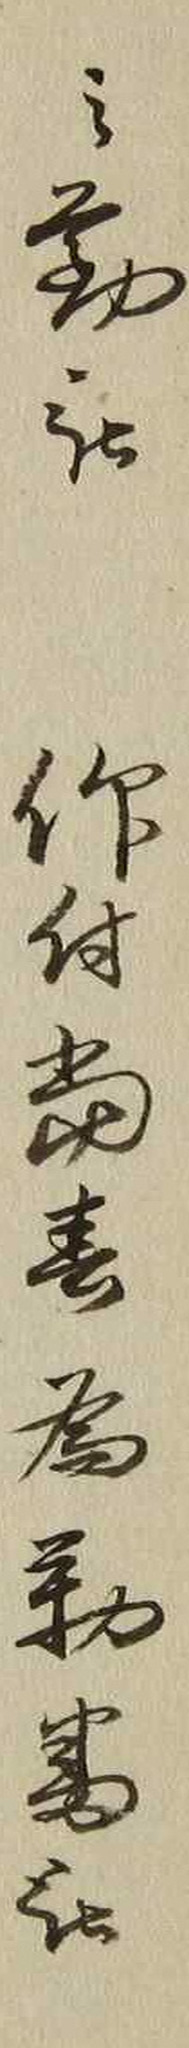之勤被仰付当春為勤番被
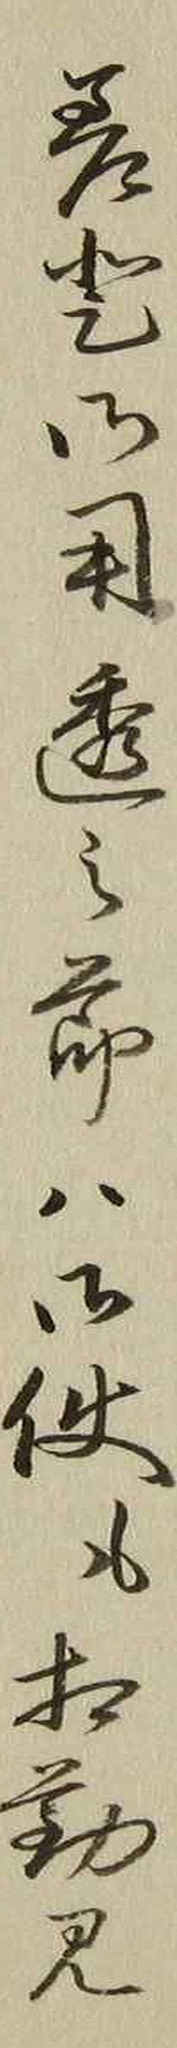差登御用透之節は御使も相勤見
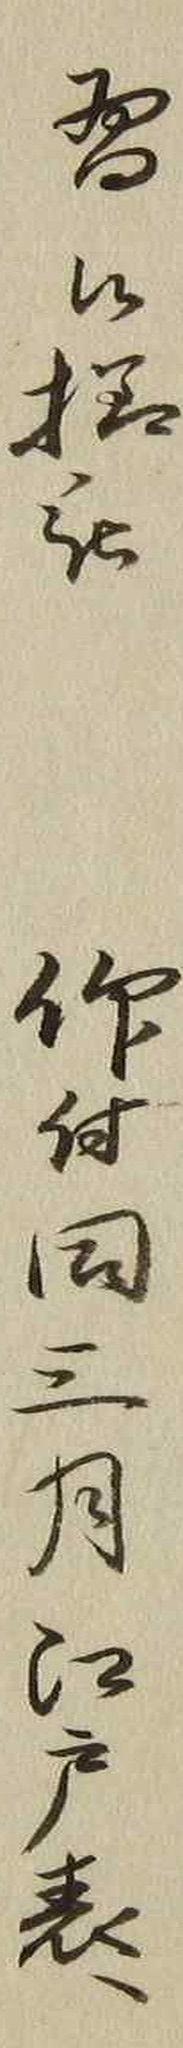習候様被仰付同三月江戸表へ
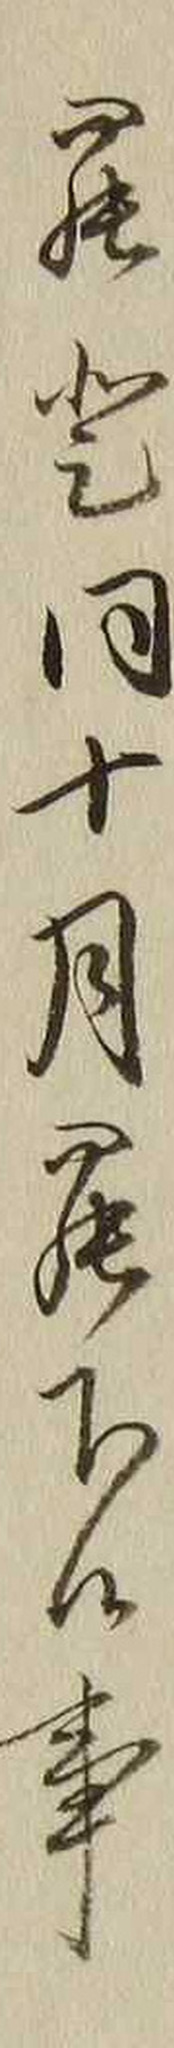罷登同十月罷下候事
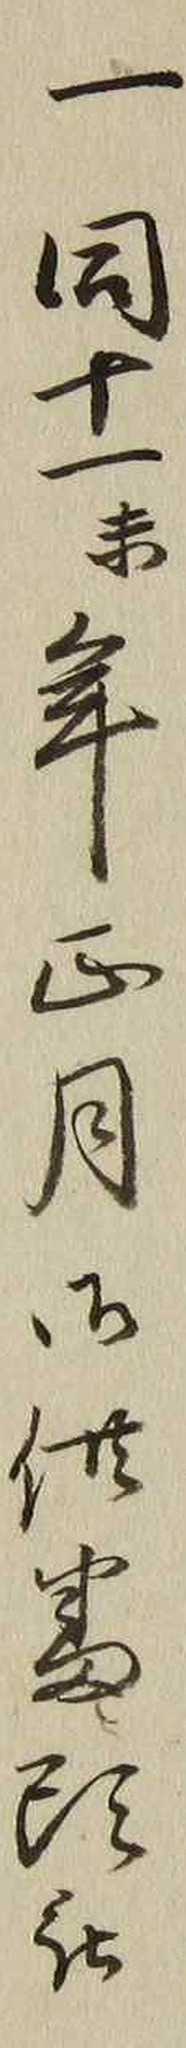一同十一末年正月御供番頭被
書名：諸士系譜　巻之133　た之部9
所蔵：会津若松市立会津図書館
